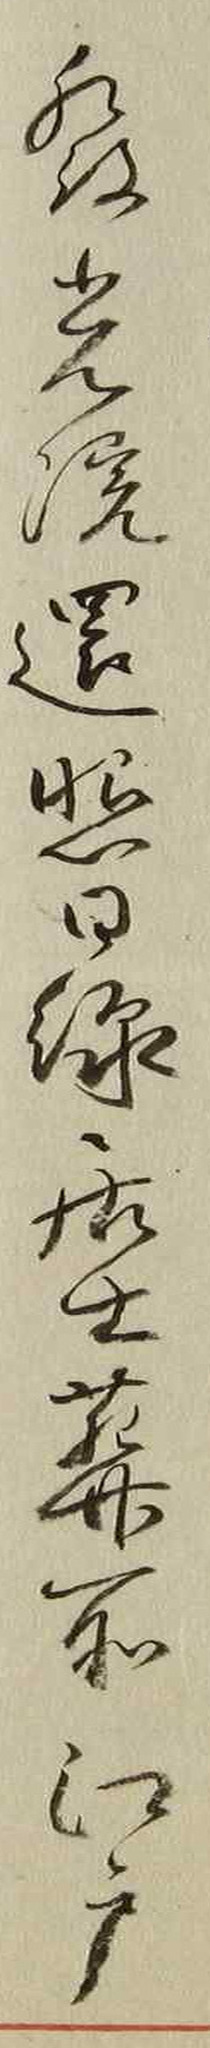発光院還照日緑居士葬所江戸
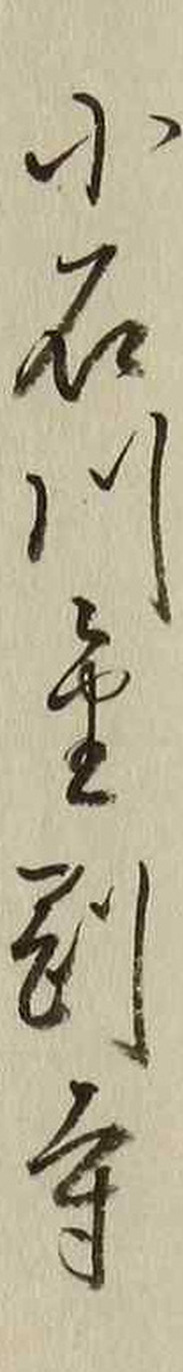小石川金剛寺
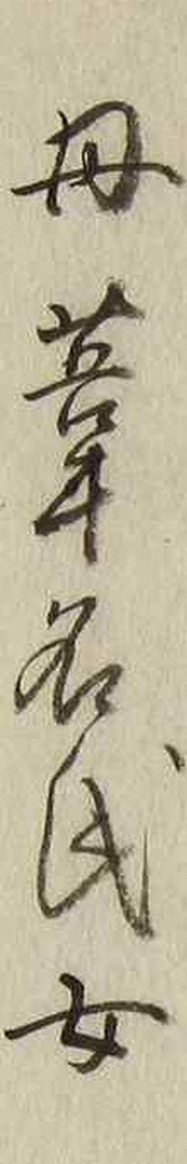母葦名氏女
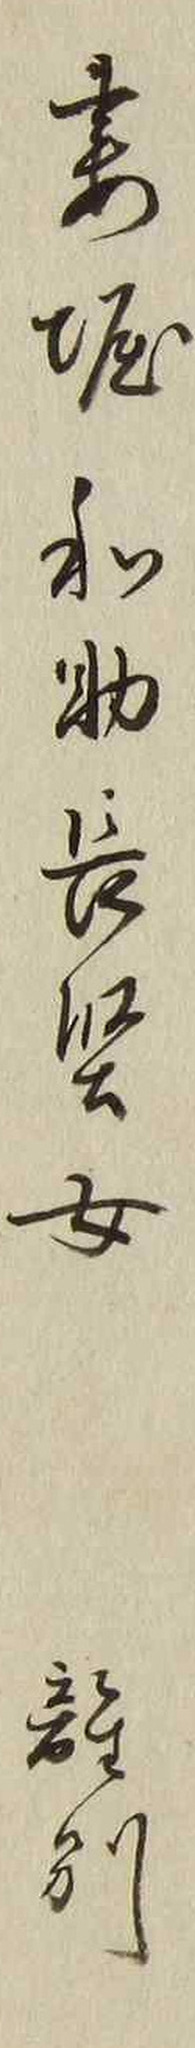妻堀和助長堅女離別

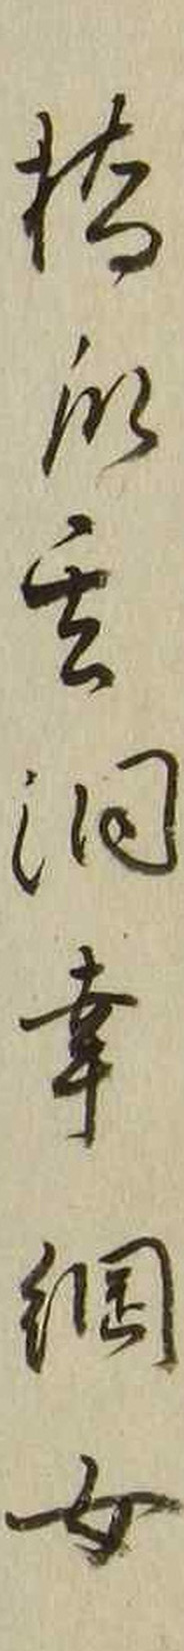橋爪玄洞幸綱女
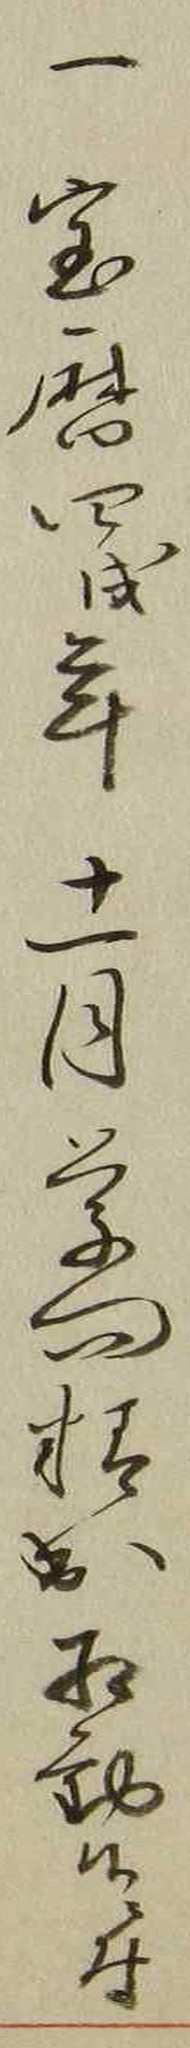一宝暦四戌年十一月学問精出相勤候に付
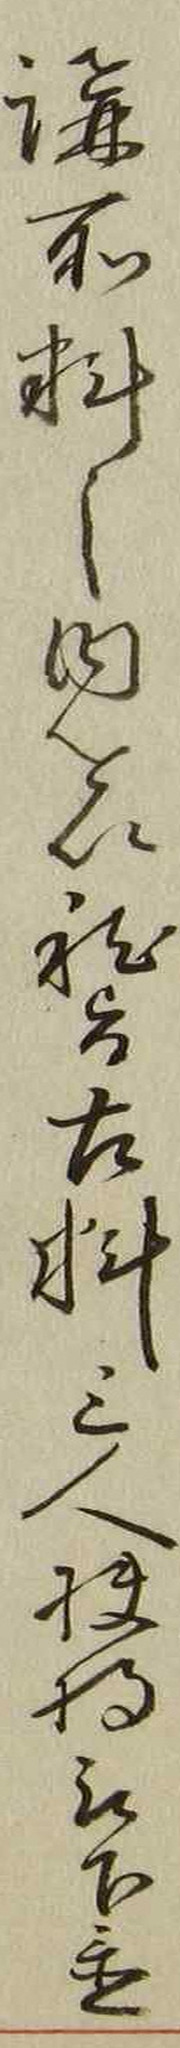講所料之内を以稽古料三人扶持被下置
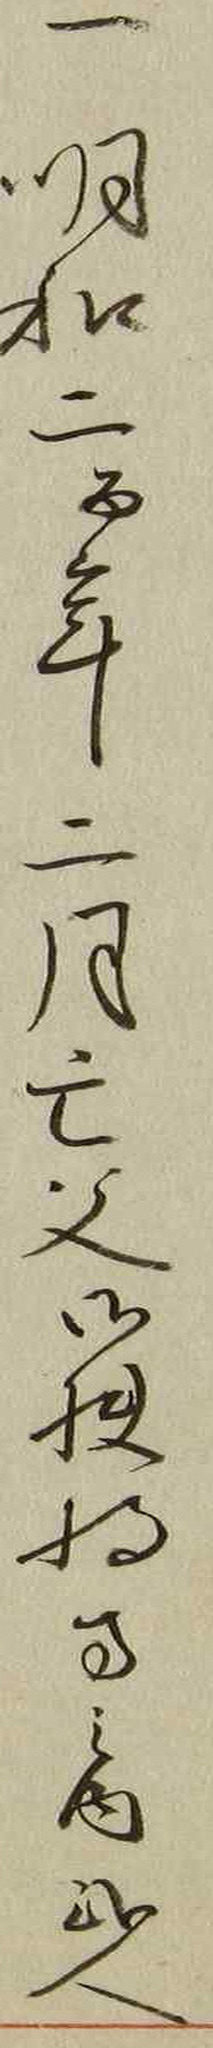一明和二酉年二月亡父御扶持方之内弐人
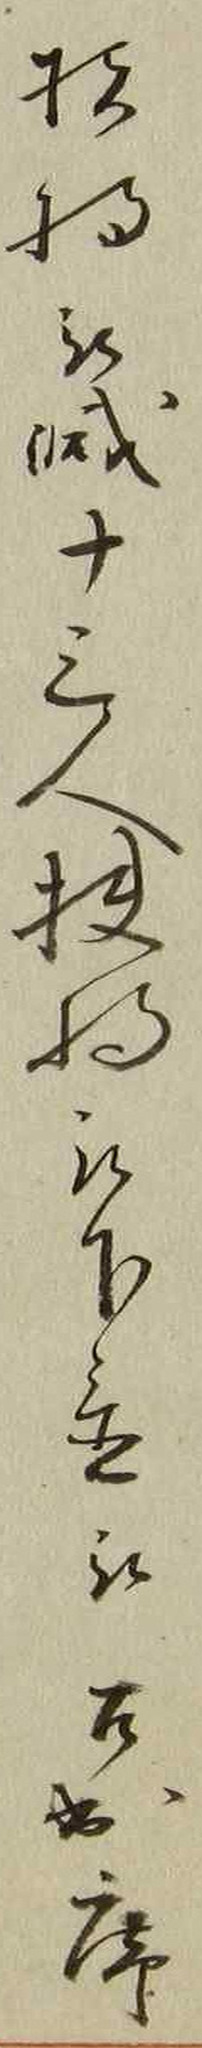扶持被減十三人扶持被下置被召出席
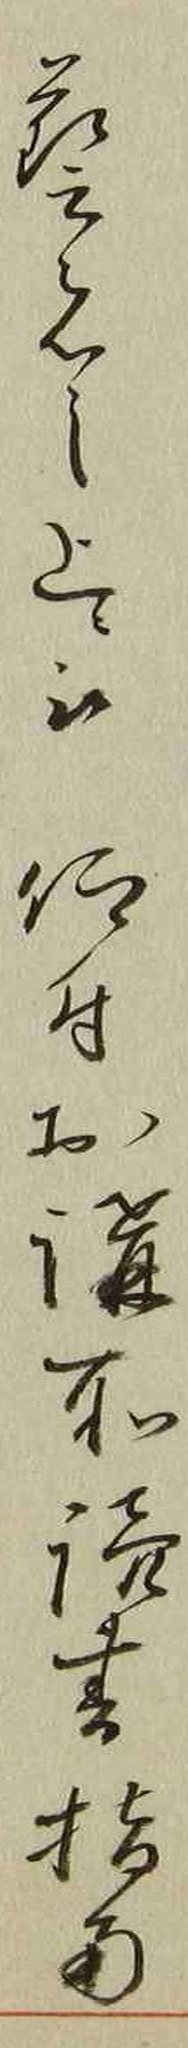芸者之上に被仰付於講所読書指南
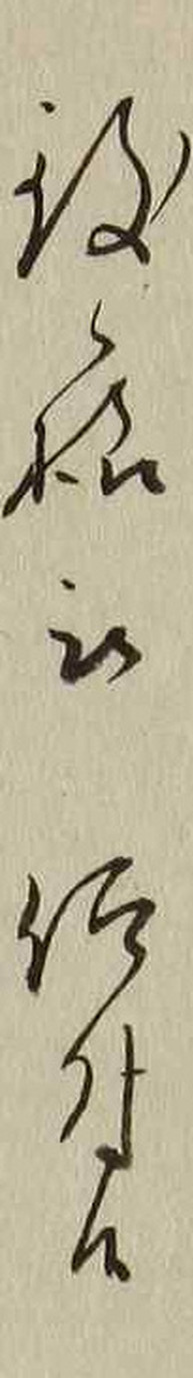致候様被仰付候
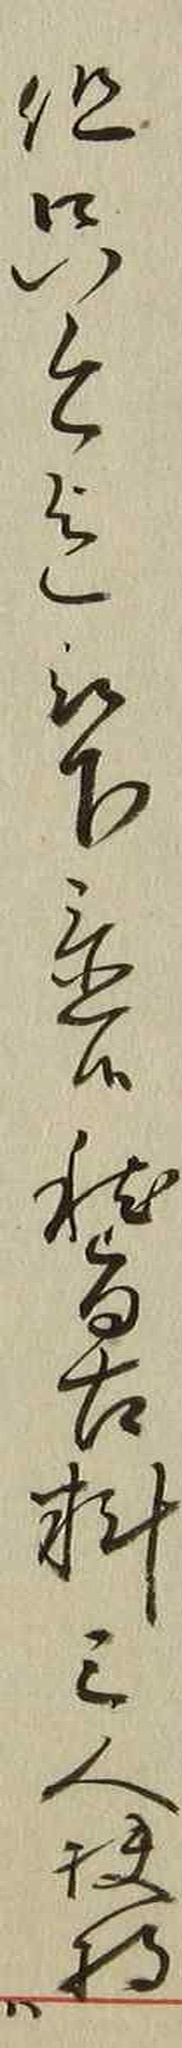但只今迄被下置候稽古料三人扶持ハ
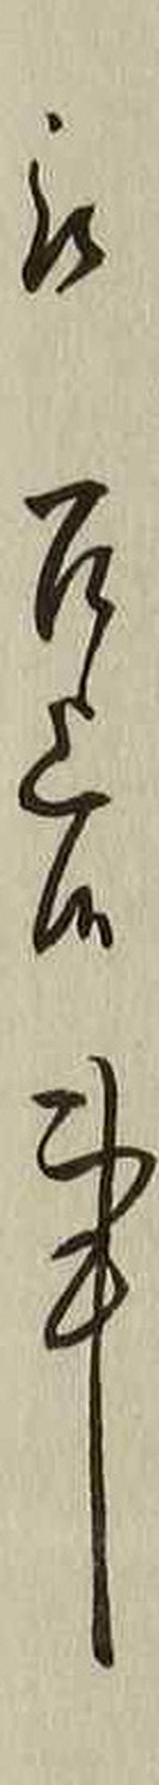被召上候事
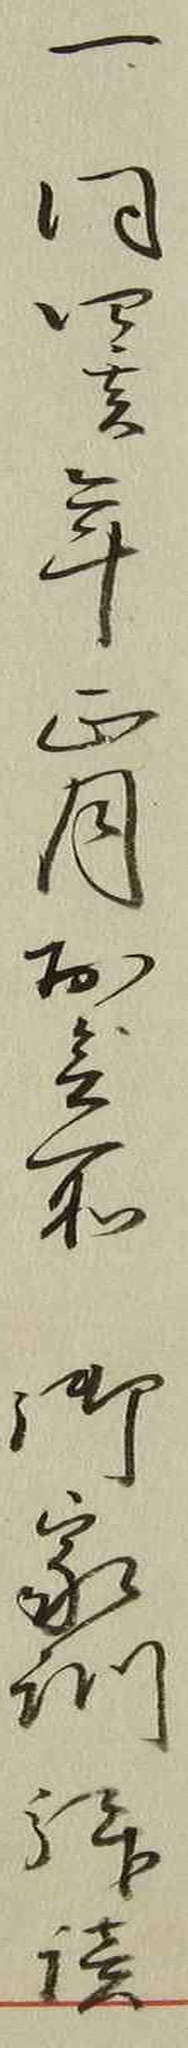一同四亥年正月於会所御家訓拝読
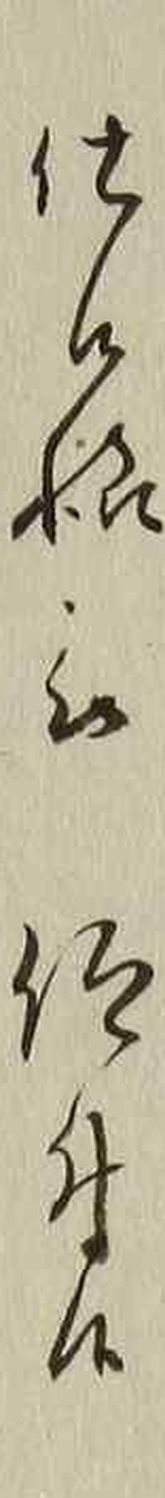仕候様被仰付候
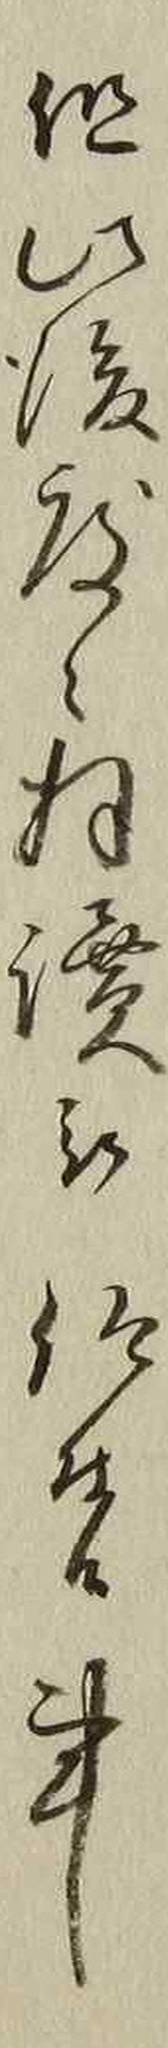但此後度々拝読被仰付候事
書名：諸士系譜　巻之3　い之部3
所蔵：会津若松市立会津図書館
